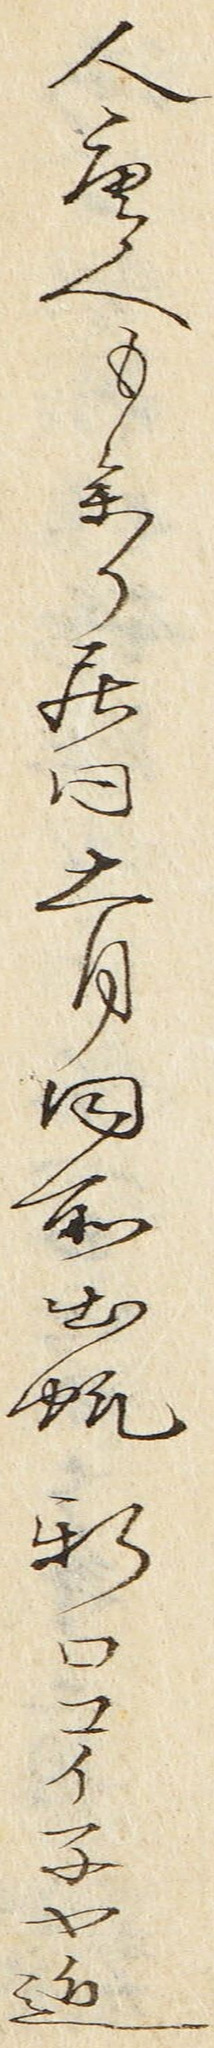人唐人も参り居曰十一月同所出帆新ロコイねヤ近

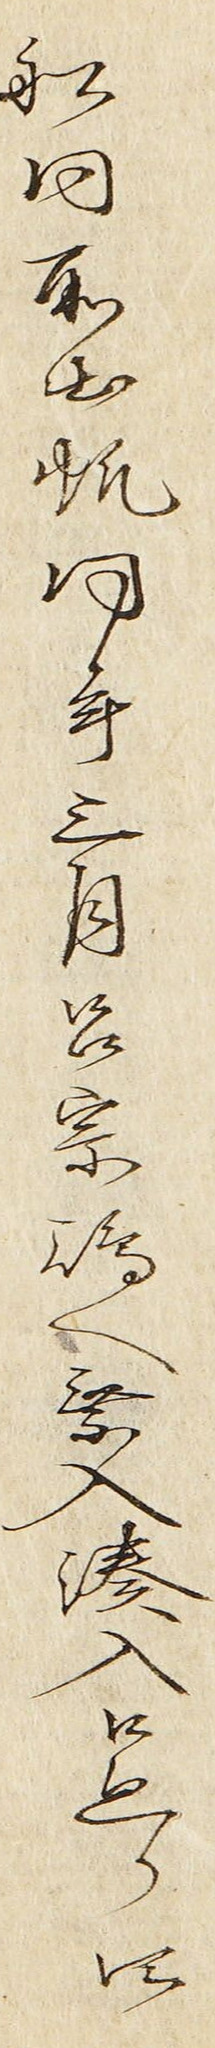船同所出帆同年三月呂宗嶋へ乗入湊入口廻り四
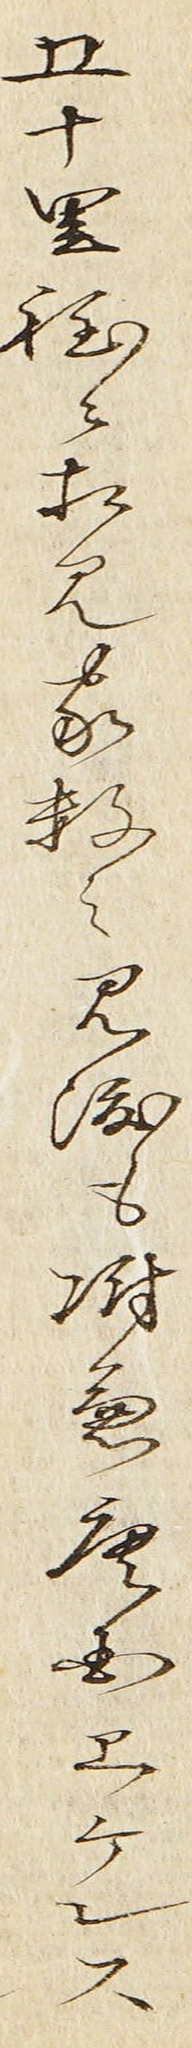五十里程に相見家数之見渡も附兼唐国エケレス
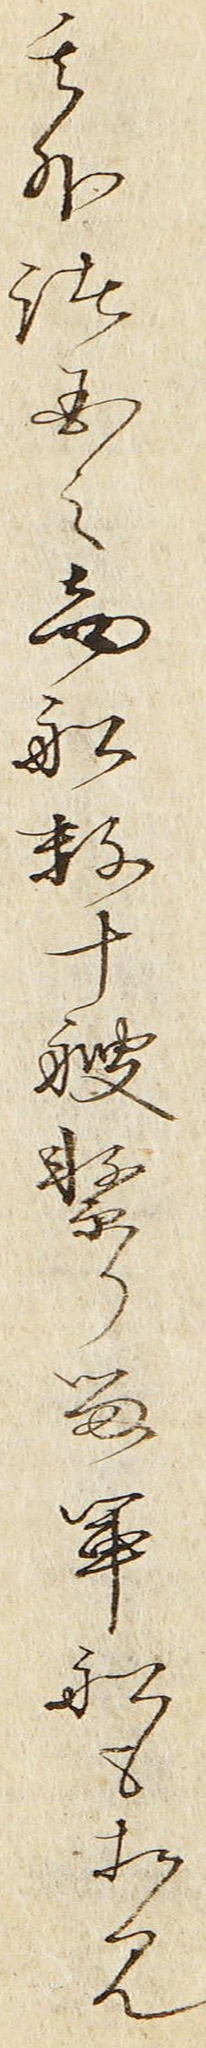其外諸国之商船数十艘繋り留軍船も相見
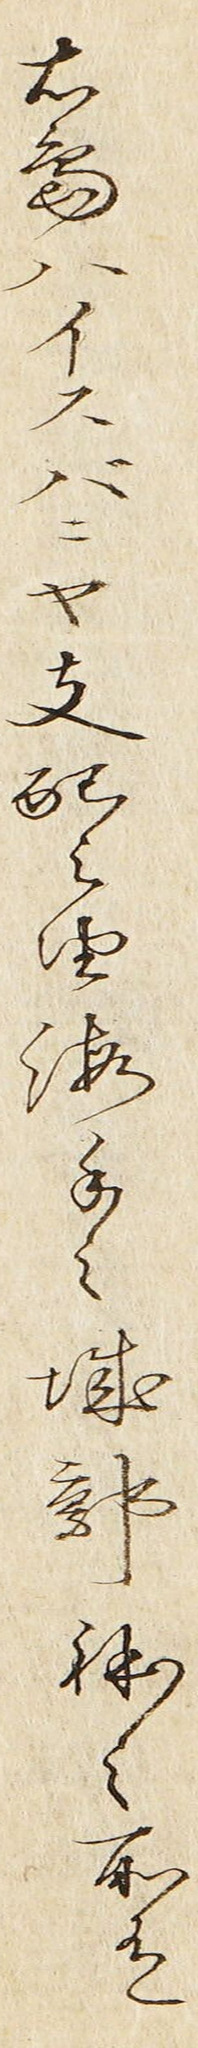右島はイスバニヤ支配之由海手之城郭躰之所有
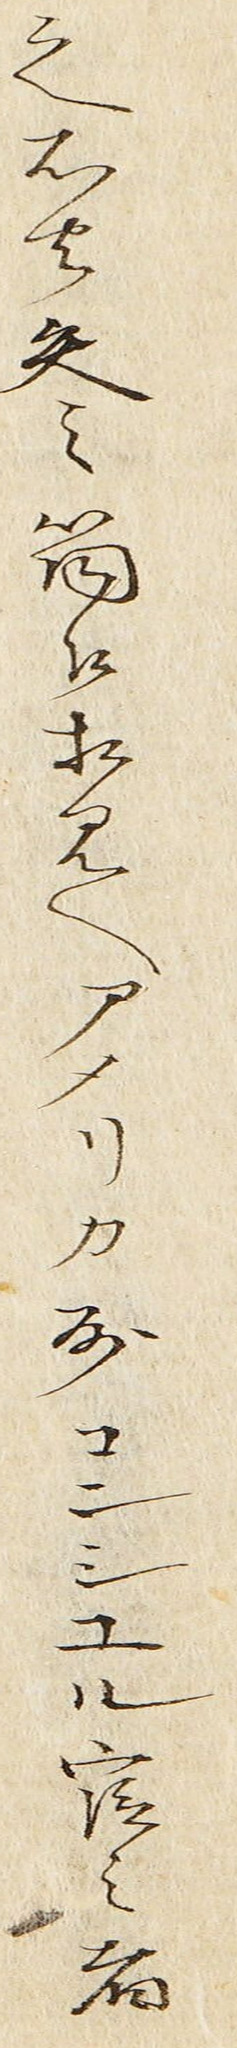之石は矢之筒口相見へアメリカ州コンシュル官之者
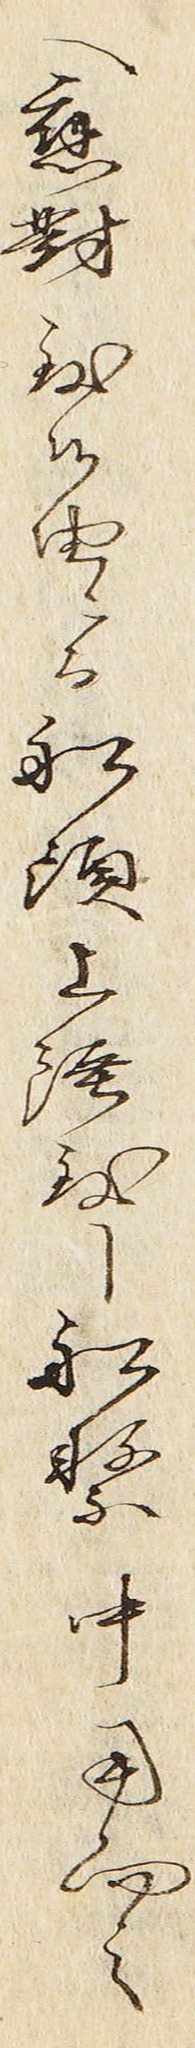へ応対致候由に而船頭上陸致し船繋中用向之
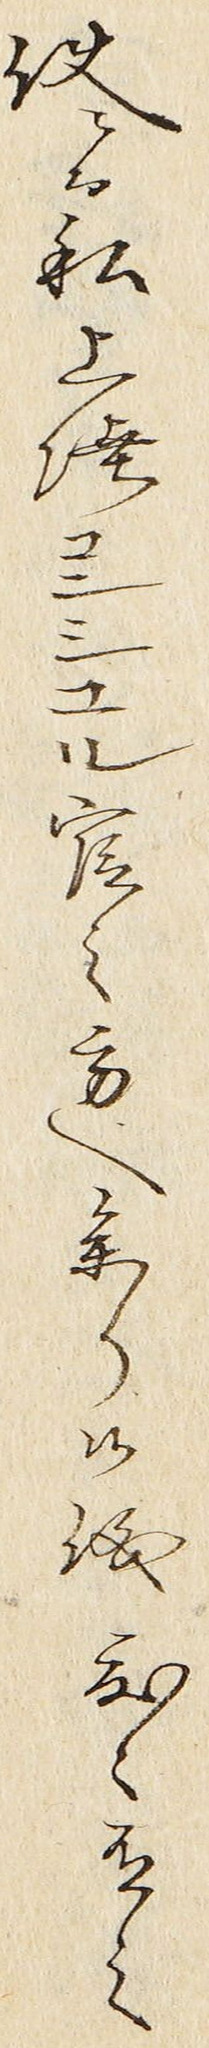使に而私上陸コンシユル官之方へ参り候儀度々有之
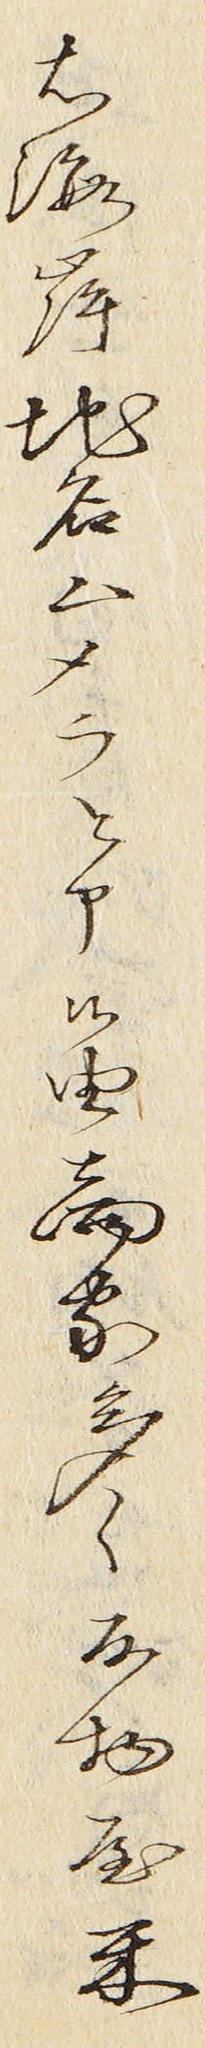右海岸地名ムメラと申候由商家多く反物屋米
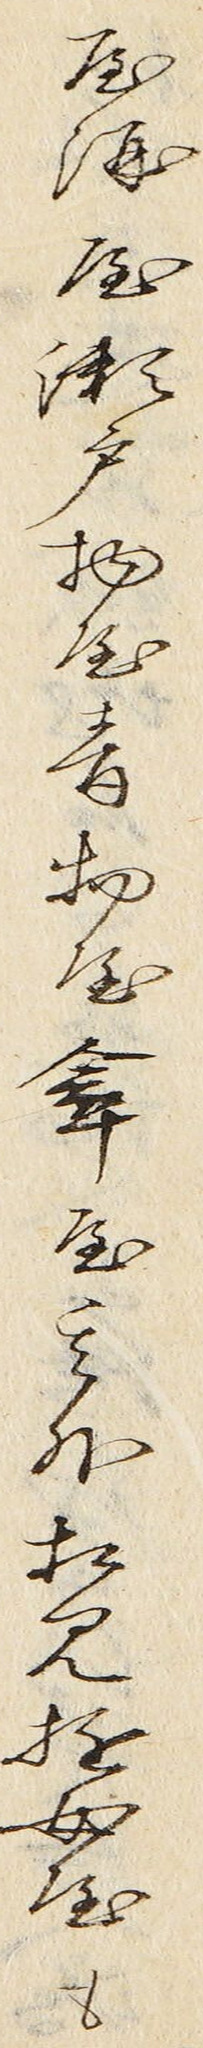屋酒屋瀬戸物屋青物屋傘屋其外相見遊女屋も
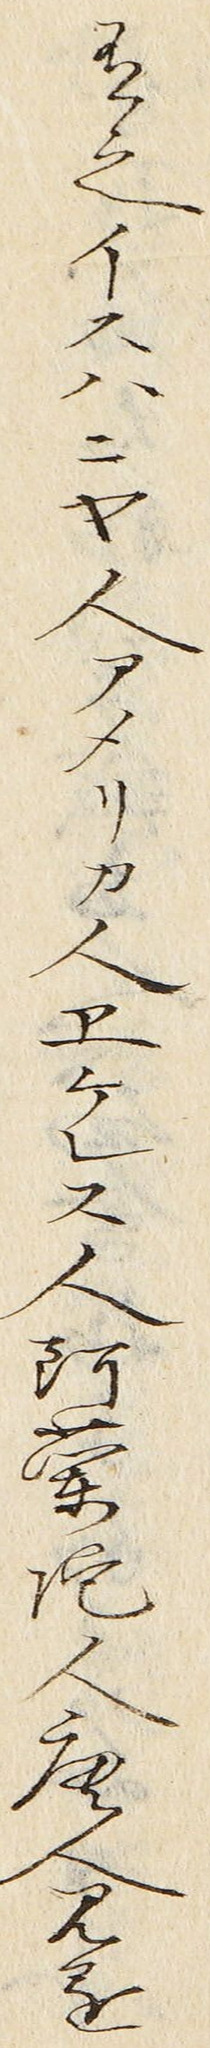有之イスハニヤ人アメリカ人エケレス人阿蘭陀人唐人見懸
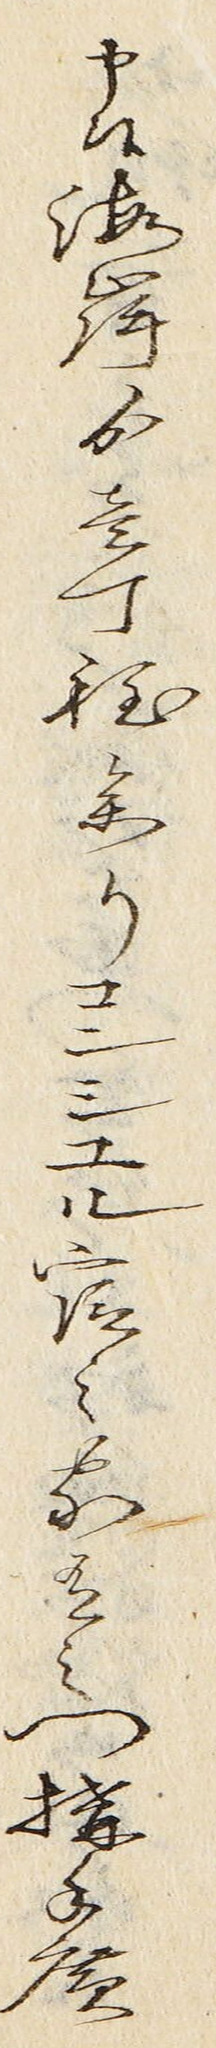申候海岸ゟ壱丁程参りコンシユル官之家有之門構手広
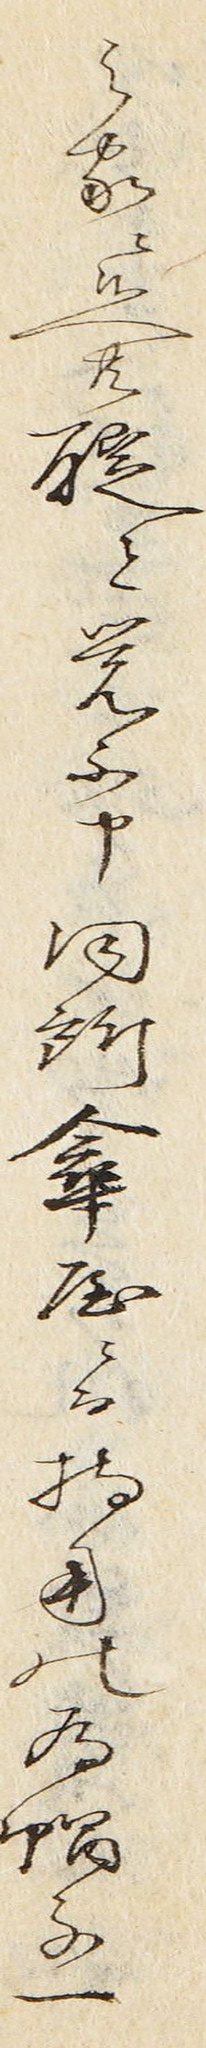之家に候へ共聢と覚不申同所傘屋に而持用の為帽子一
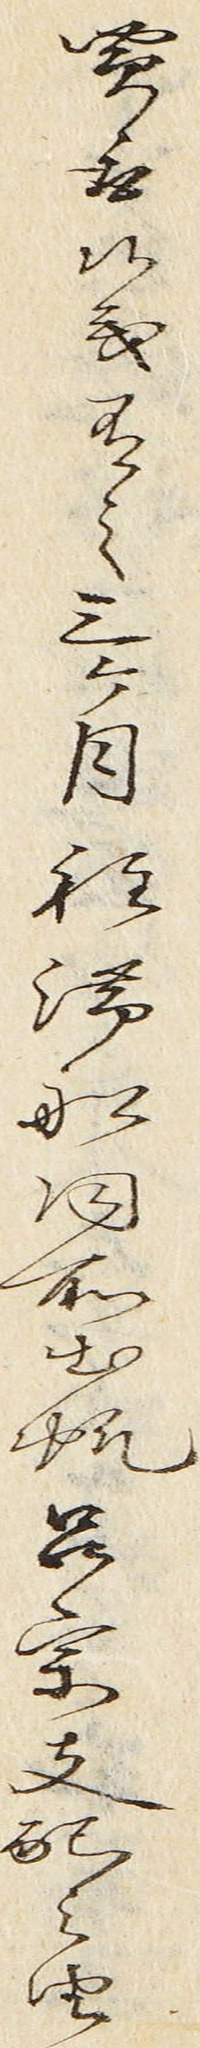買取候義有之三ヶ月程滞船同所出帆呂宗支配之由
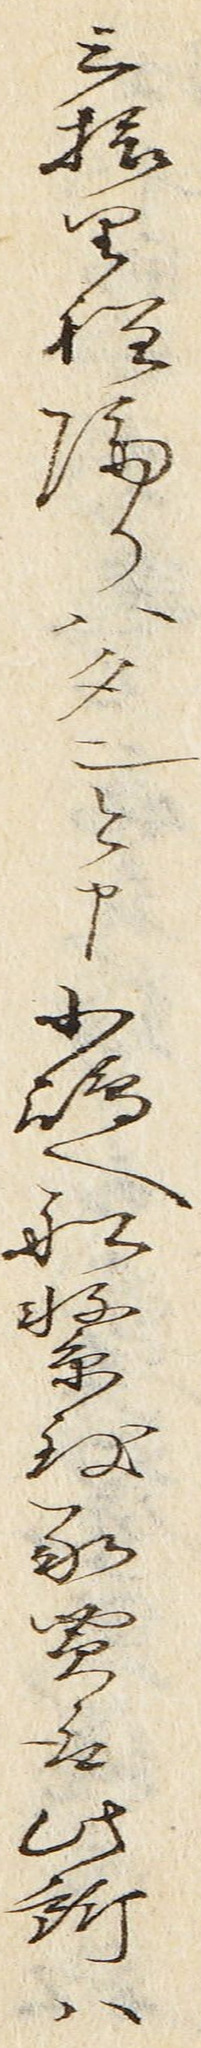三拾里程帰りハタンと申小嶋へ船繋致豕買取此所は
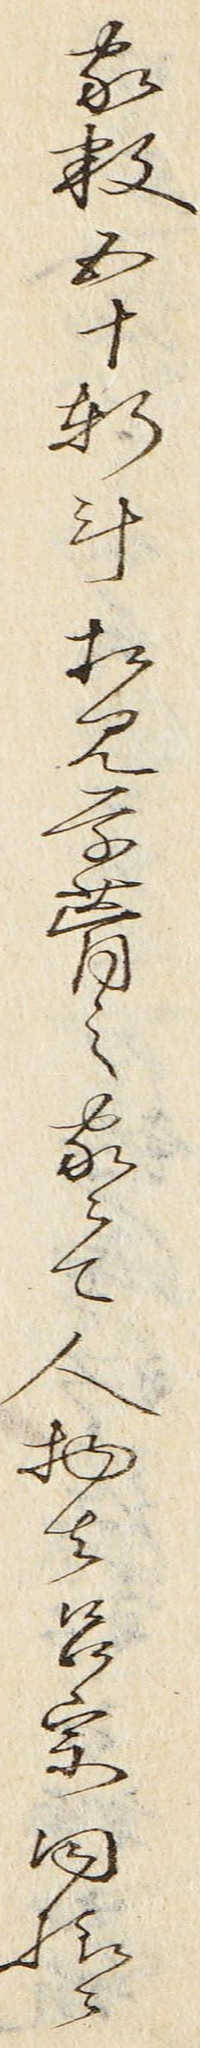家数五十軒計相見草葺之家にて人物は呂宗同様に
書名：土佐中浜万次郎漂流記
